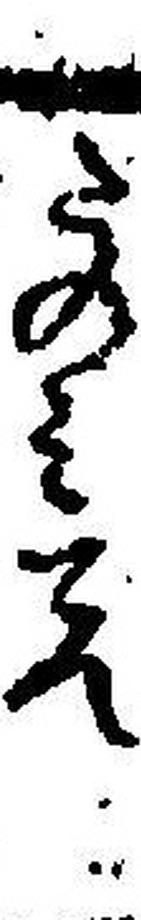たのみてん
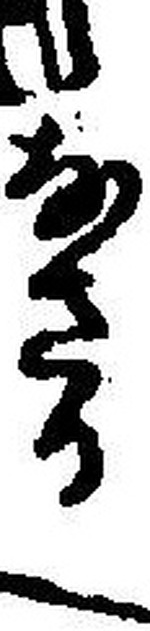なさり
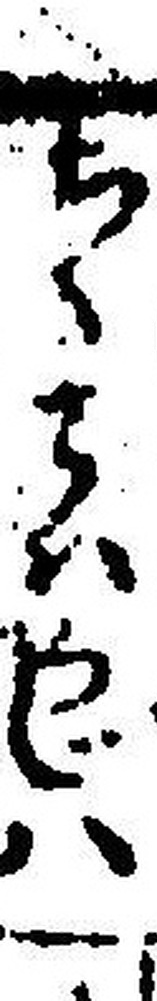ちくてはやじは
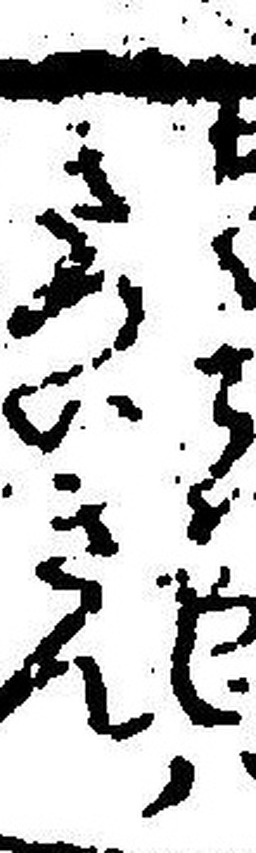きめいきん
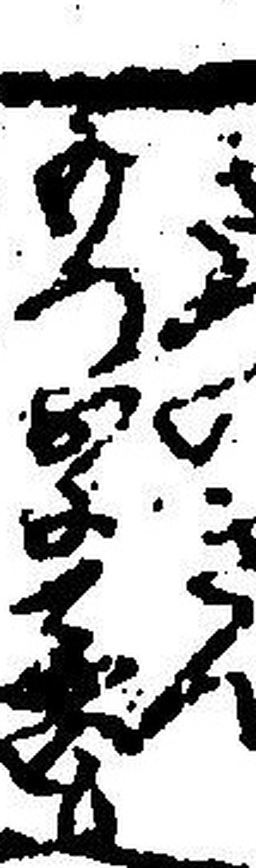もつおにてやいも
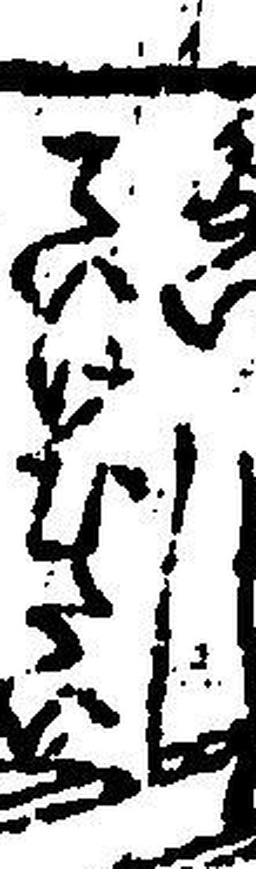ていけむたい
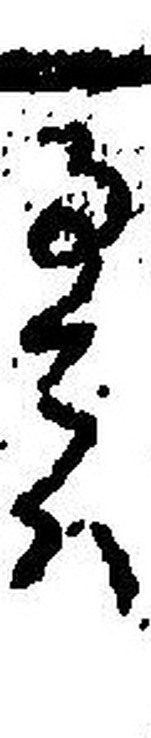事ては
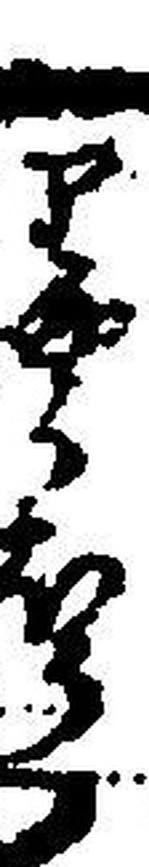りやうほう
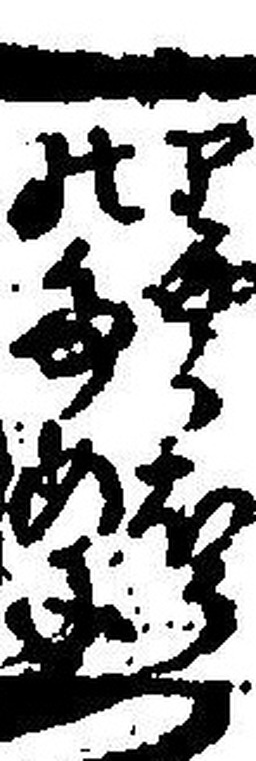のために
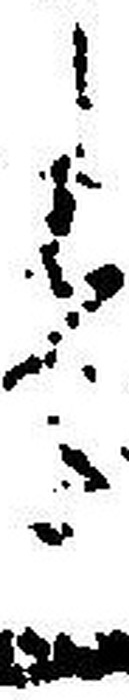はんだ
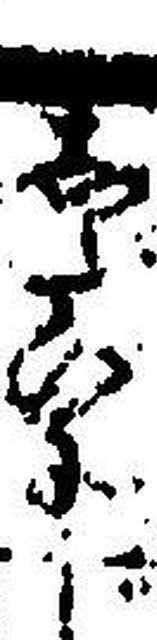しだいに
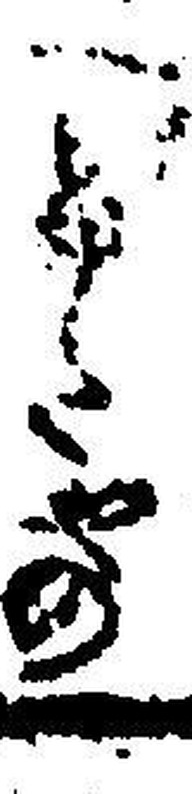げたやの
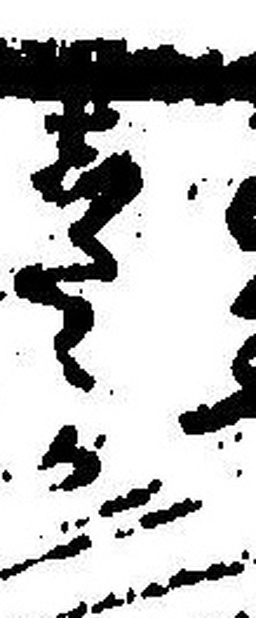したゝか
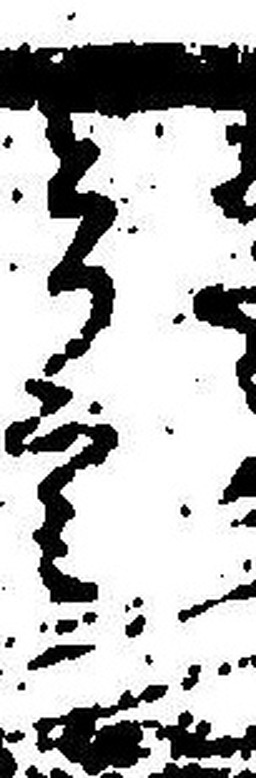とりこみ
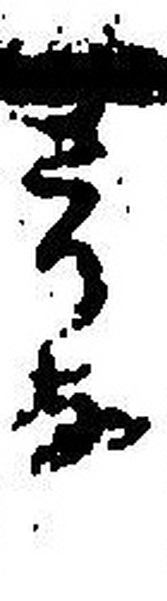さりな
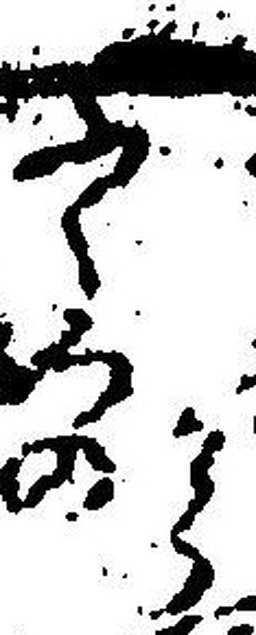ふくろの
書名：天竺儲之筋 / 市場通笑作
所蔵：東京大学総合図書館 General Library in the University of Tokyo, JAPAN
